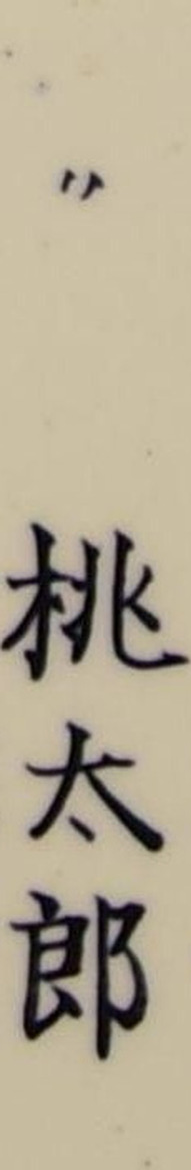桃太郎
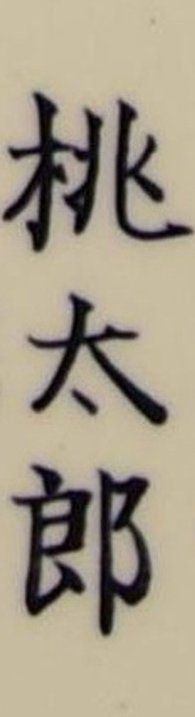桃太郎
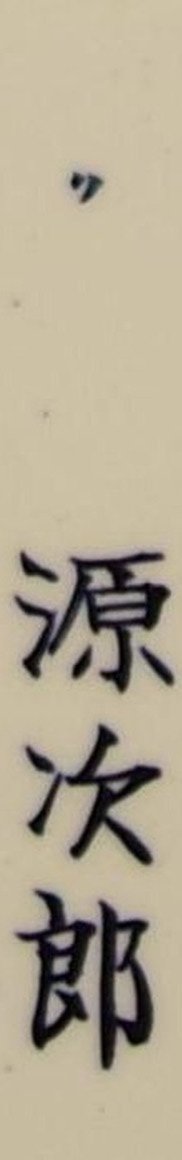源次郎
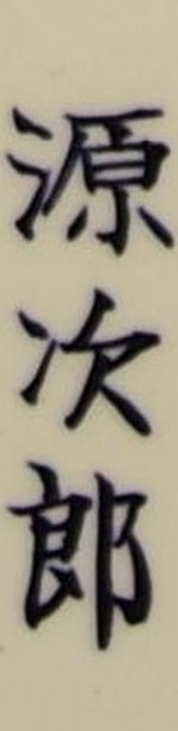源次郎
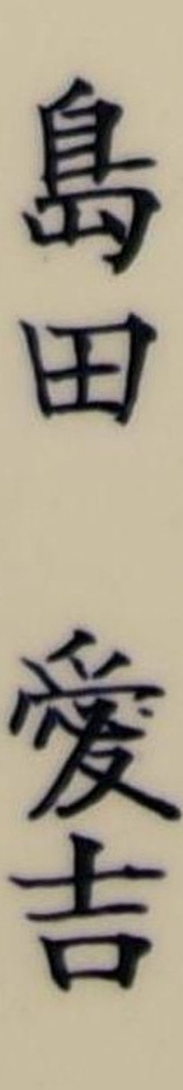島田愛吉
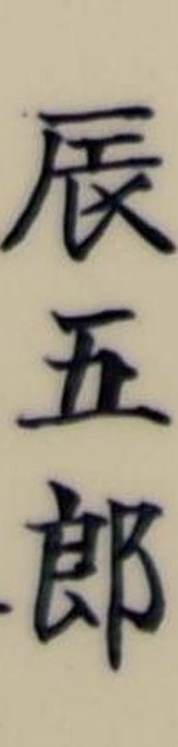辰五郎
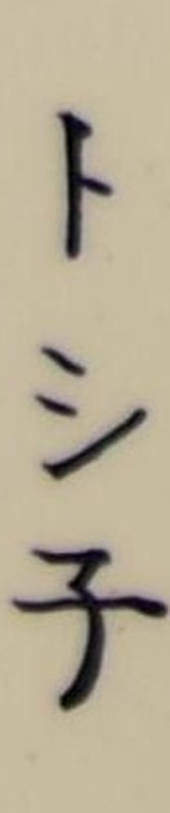トシ子
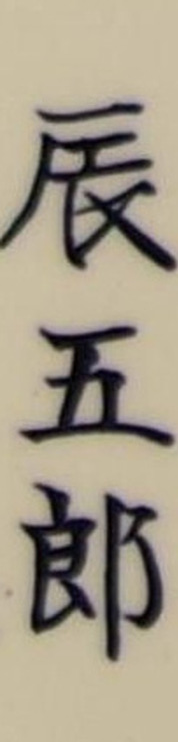辰五郎
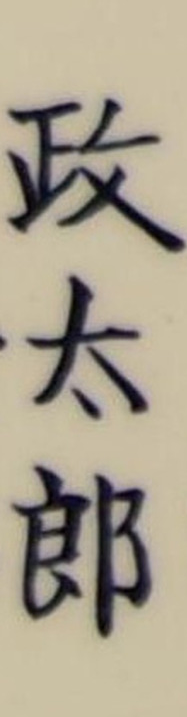政太郎
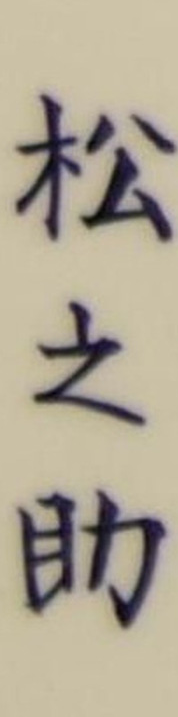松之助
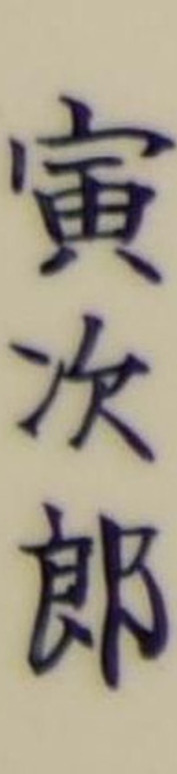寅次郎

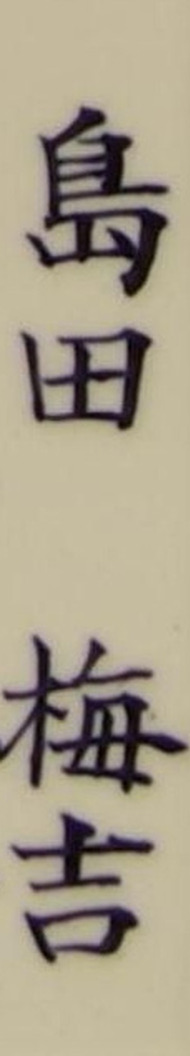島田梅吉
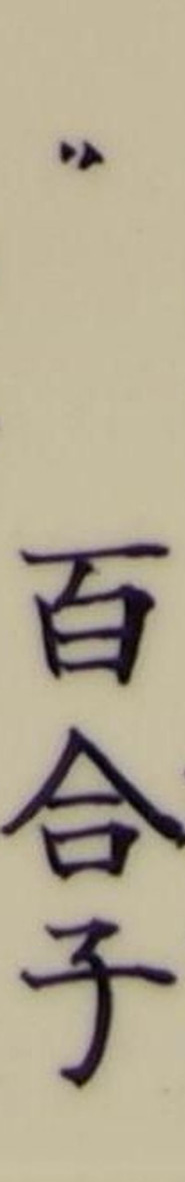百合子
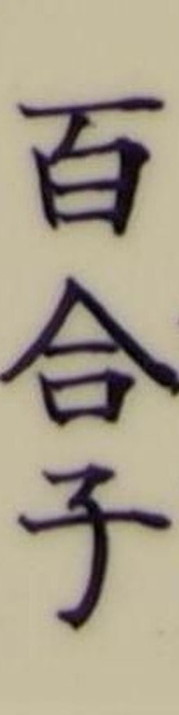百合子
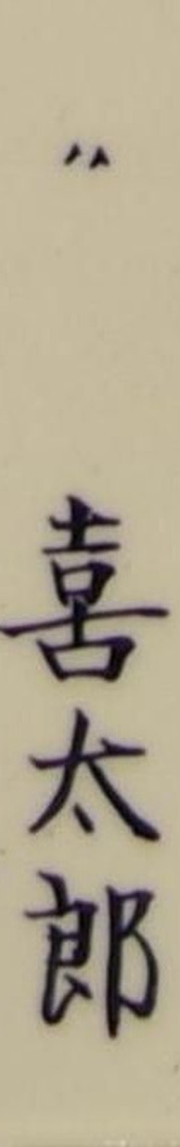喜太郎
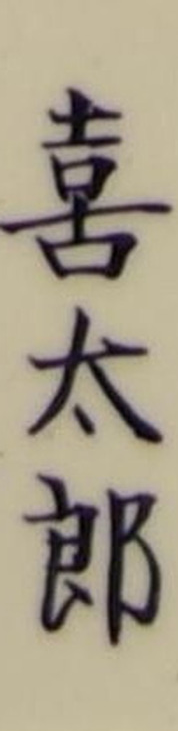喜太郎
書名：A~D
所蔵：koyasan kongobuji
